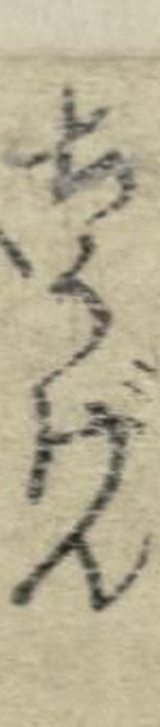ちうげん
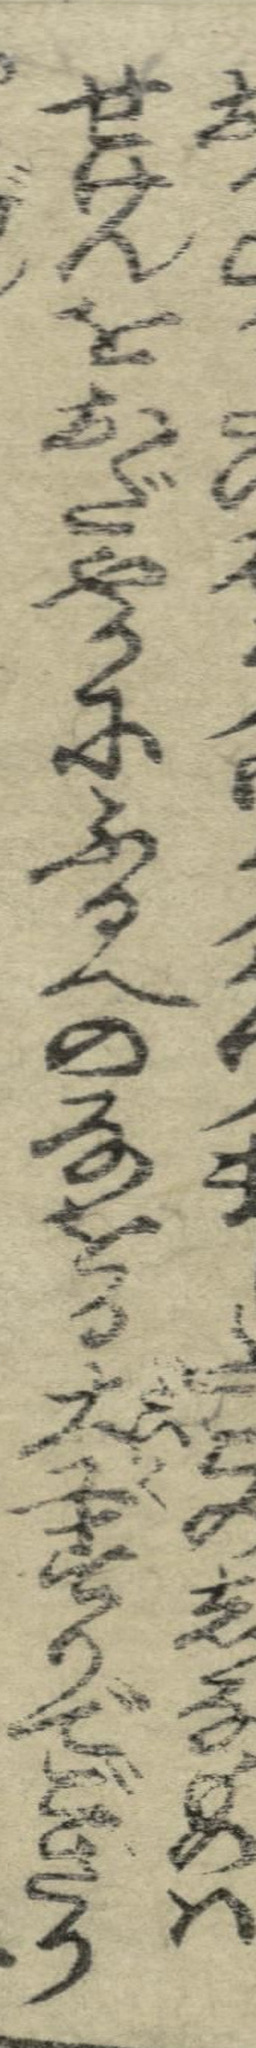せけんをおだやかにふるへのなをる大工すりでござります
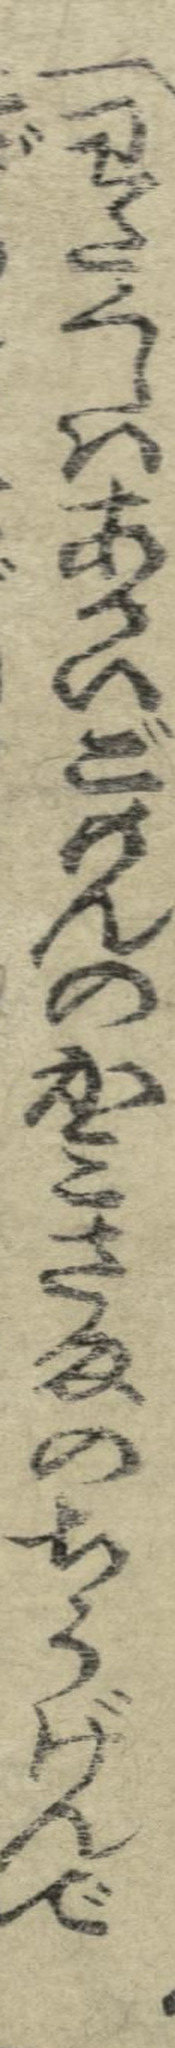〽わたくしはあかいごもんのかみさまのちうげんで
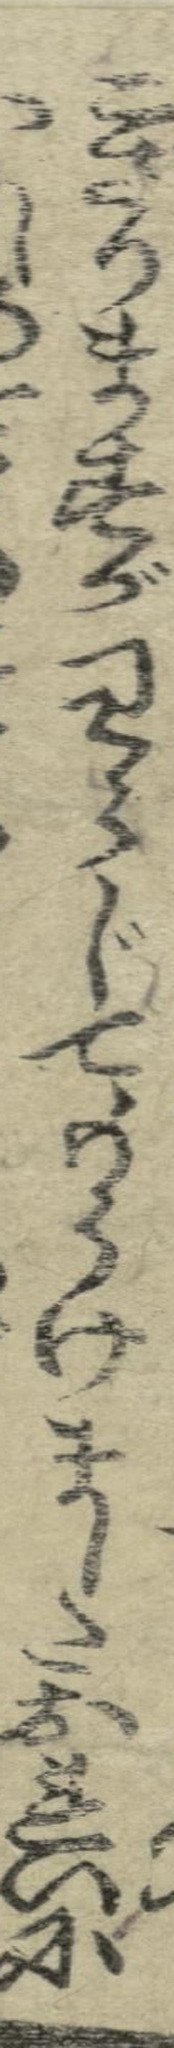ござりますがわらじてもうけましたおれいに
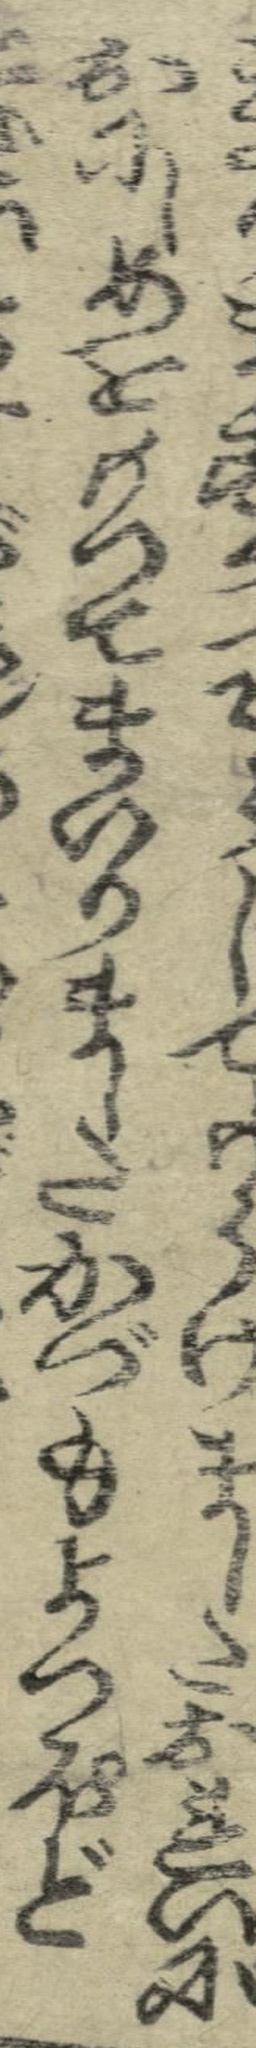おにしめをもつてまいりましたかづもよつほど
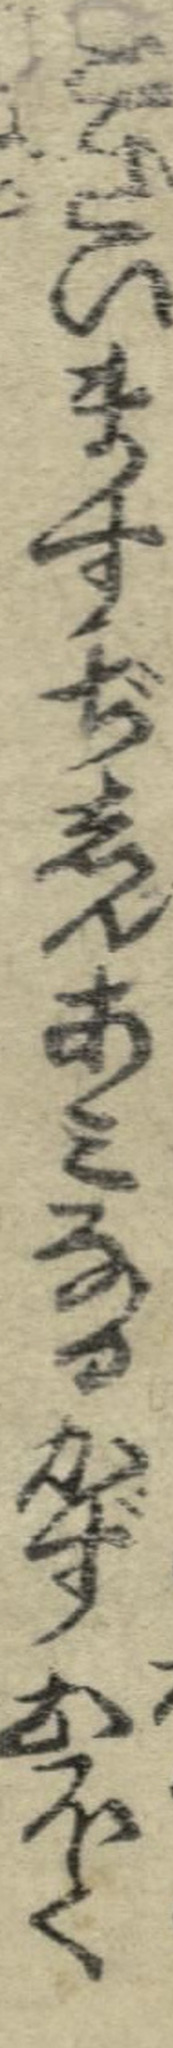ございますぢしんあみなるかずおほく
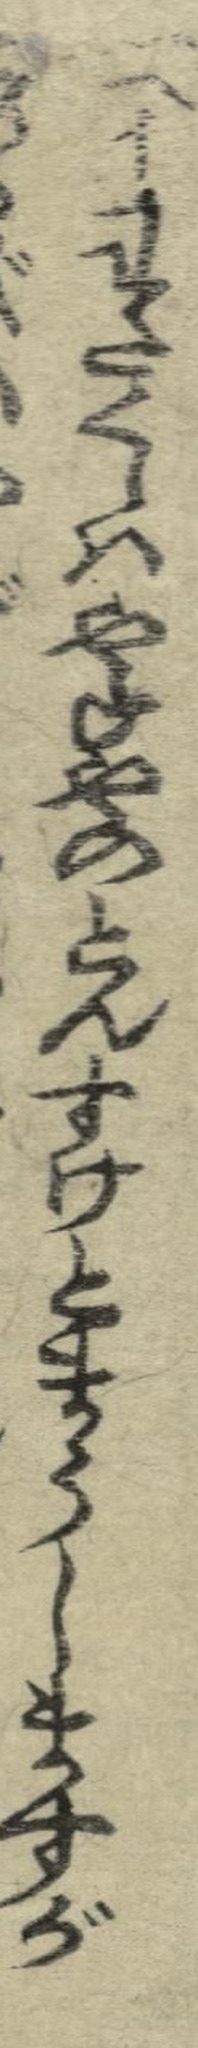〽ヘイわたくしはやねやのとんすけとまうしますが
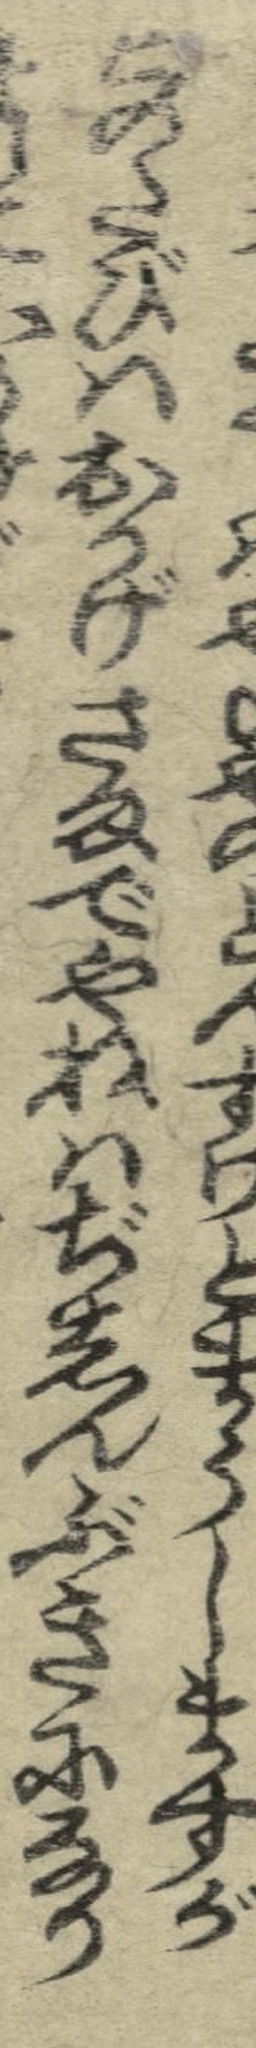このたびはおかげさまでやねはぢしんぶきになり
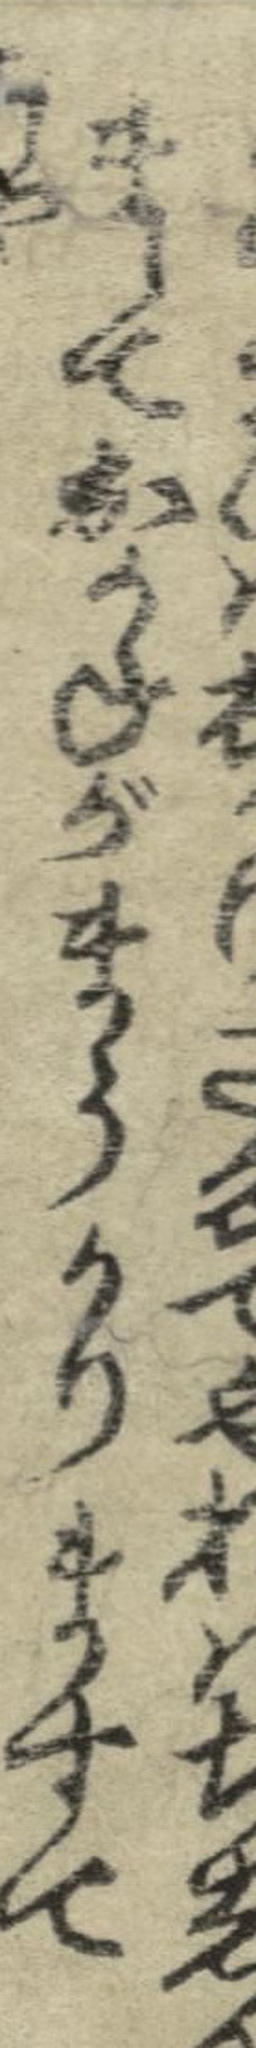ましておかねがまうかりますて
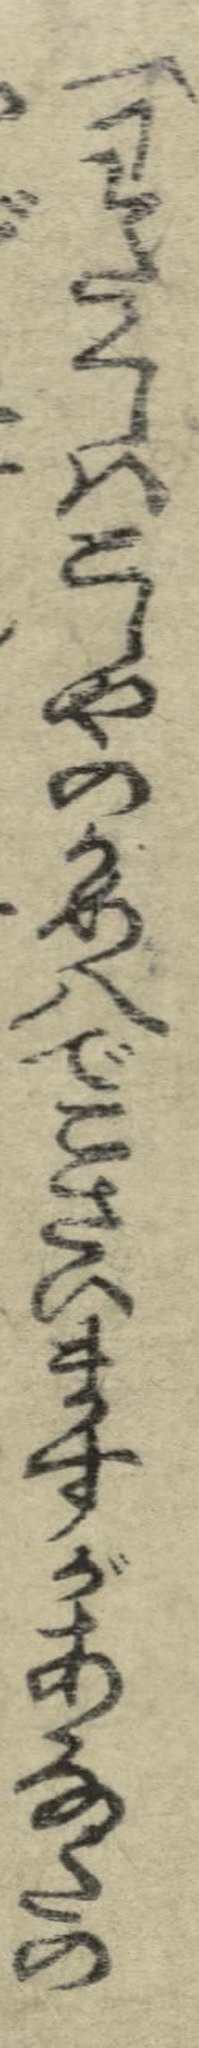〽わたくしはとしやのうめ八でこさいますがあなたの
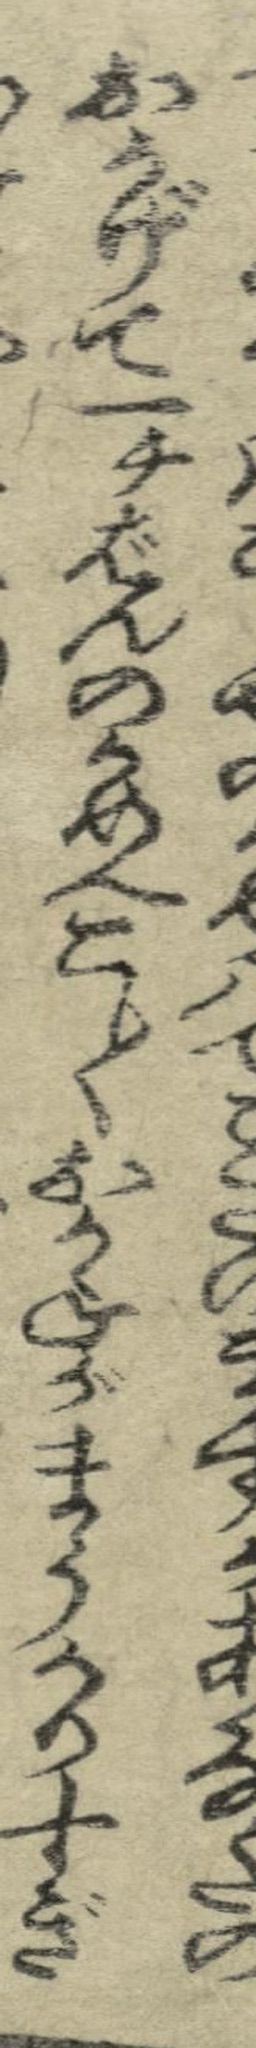おかげて一チばんのうめへこし〳〵おかねがまうかりすぎ
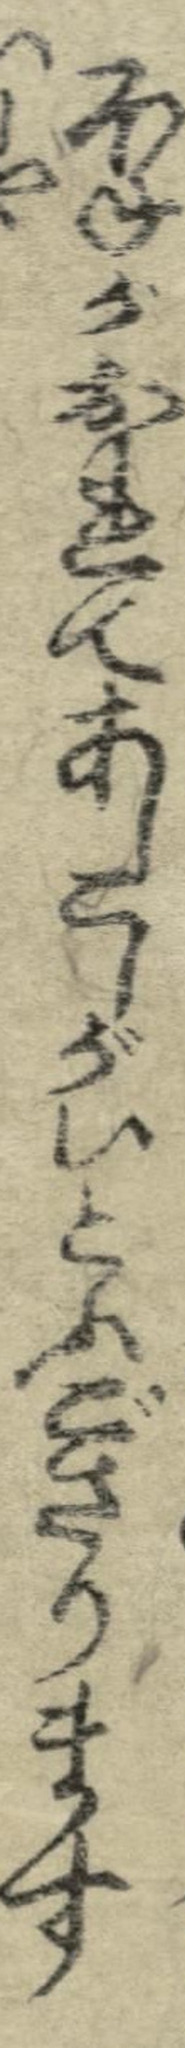ほねかおれてあしこしがいとふごさります
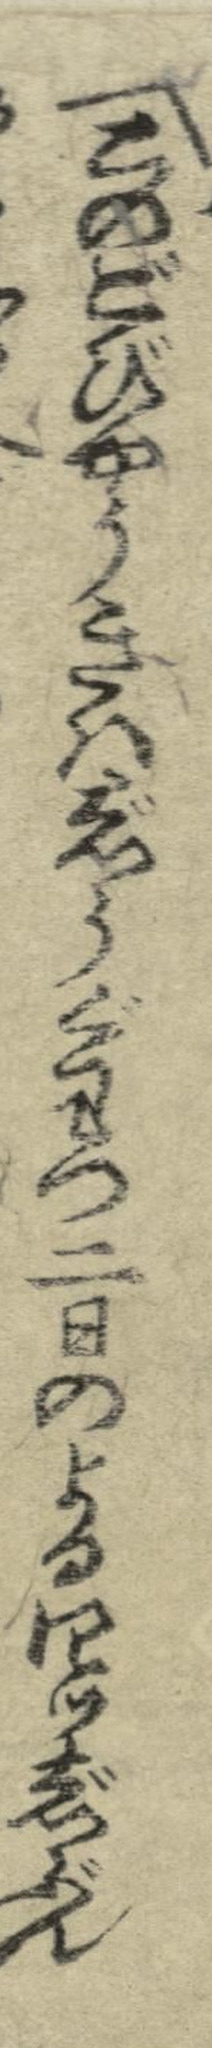〽このごびやうきはじうぐわつ二日のよる四ツじぶん
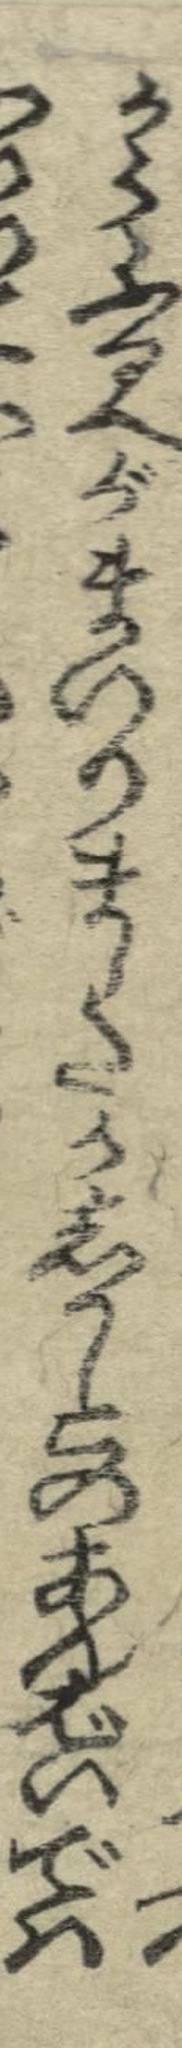からふるへがまいりましたかしかしこのあんばいでは
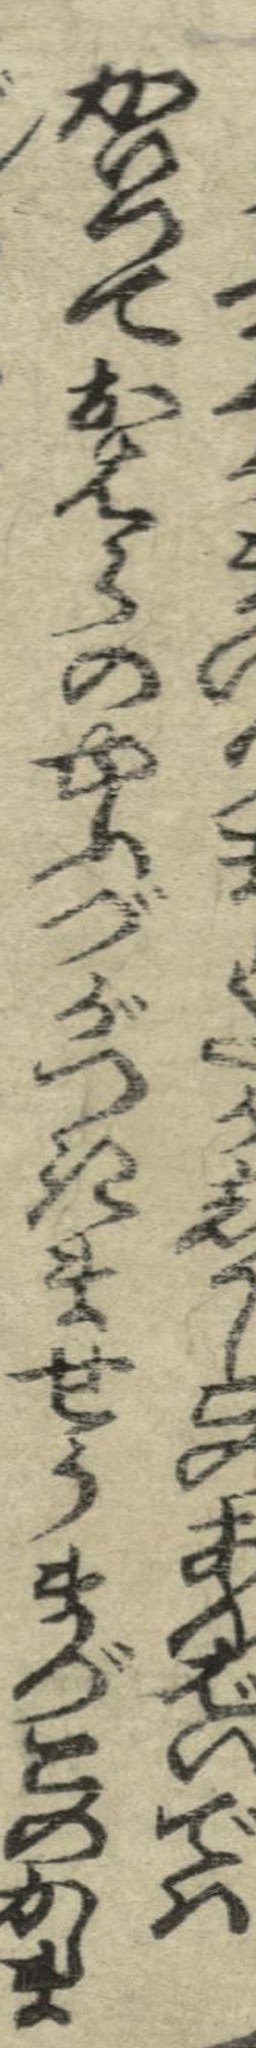かいつておはらのやふづがつきませうまづこのかしま
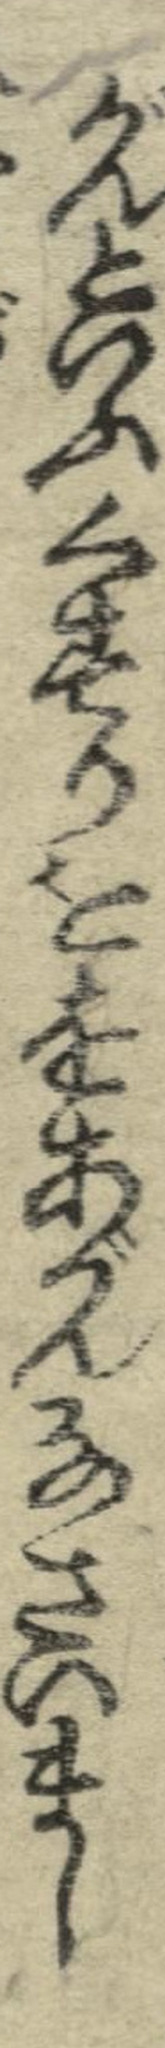がんといふくすりををあがんなさいまし
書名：[鯰への見舞い]
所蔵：東京大学地震研究所図書室 Earthquake Research Institute Library, The University of Tokyo, JAPAN
